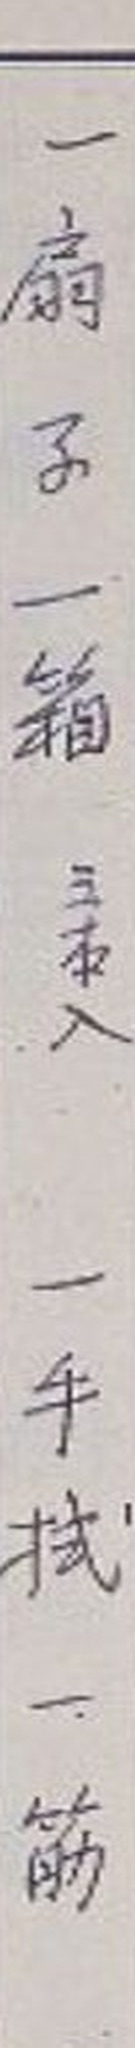一扇子一箱三本入一手拭一筋
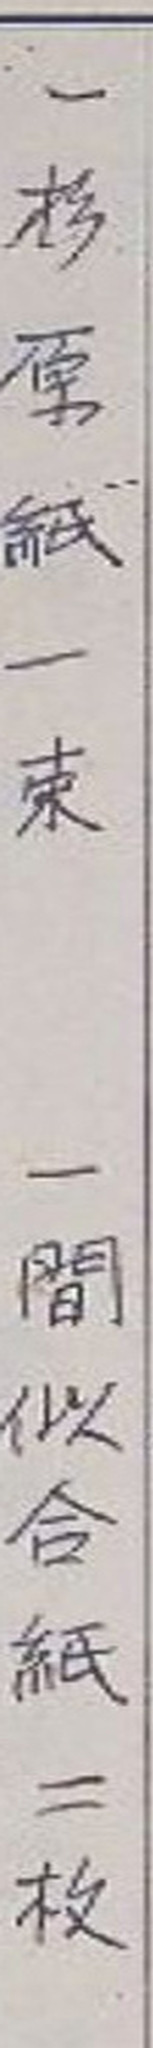一杉原紙一束一間似合紙二枚
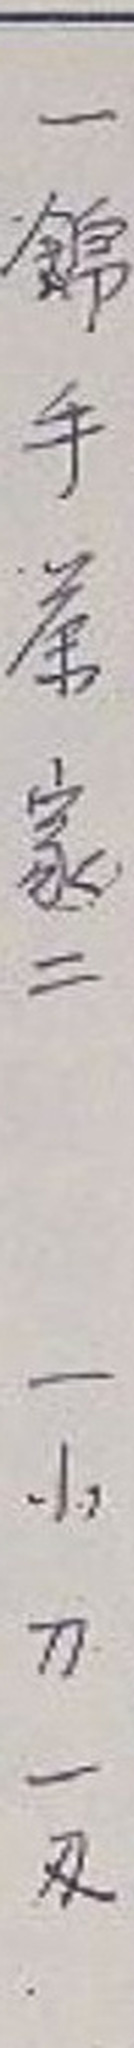一錦手茶家二一小刀一刃
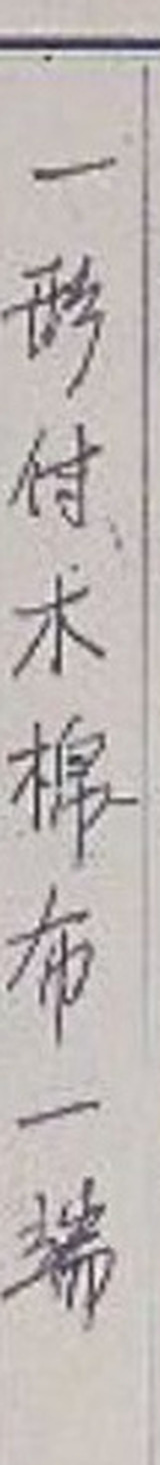一形付木棉布一端
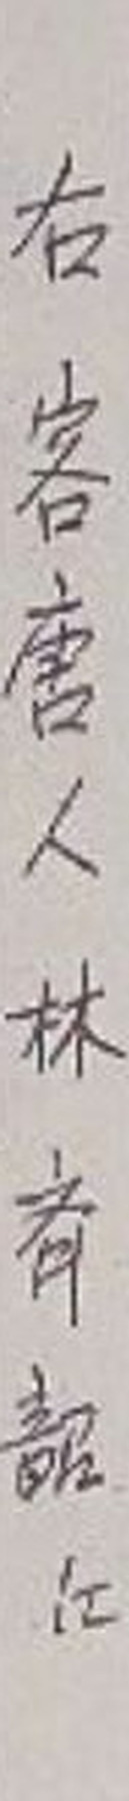右客唐人林斉韶え
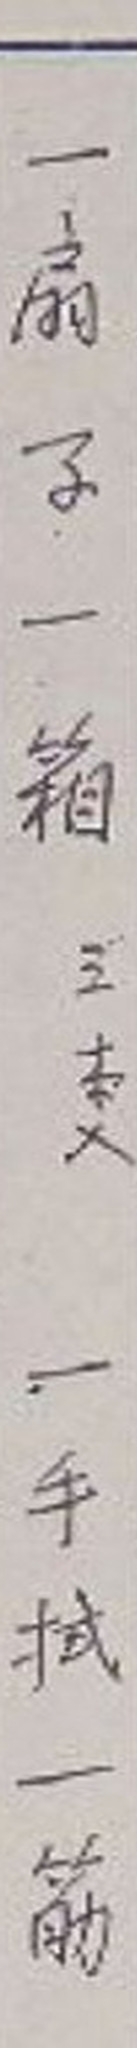一扇子一箱三本入一手拭一筋

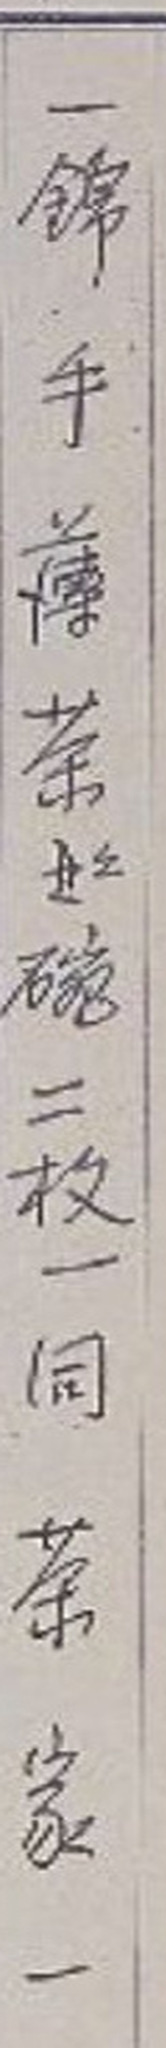一錦手薄茶々碗二枚一同茶家一
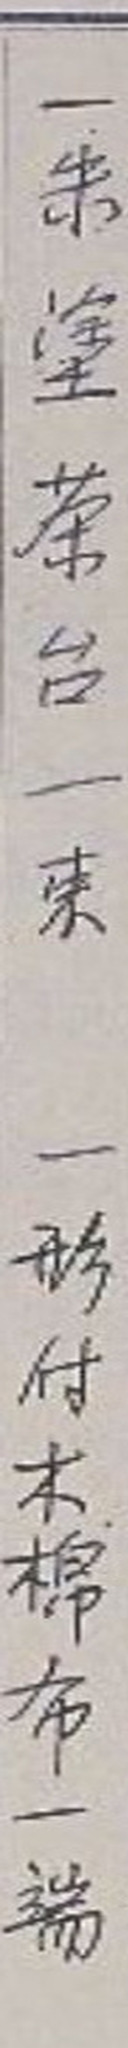一朱塗茶台一束一形付木棉布一端
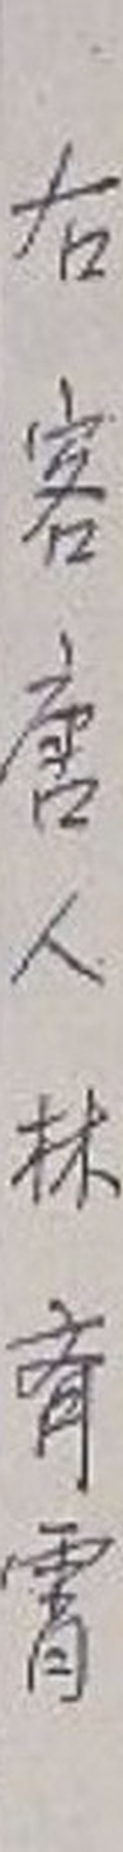右客唐人林斉霄
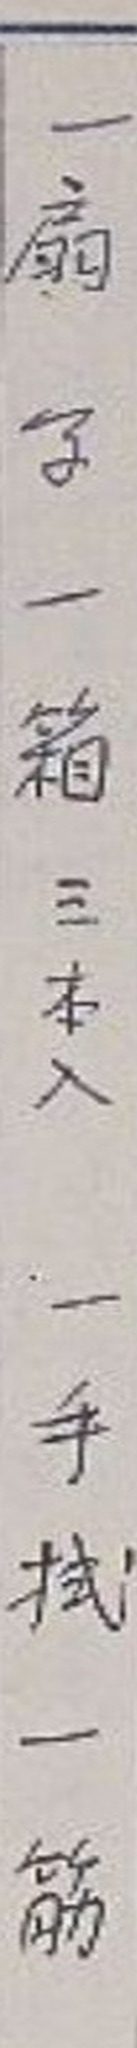一扇子一箱三本入一手拭一筋
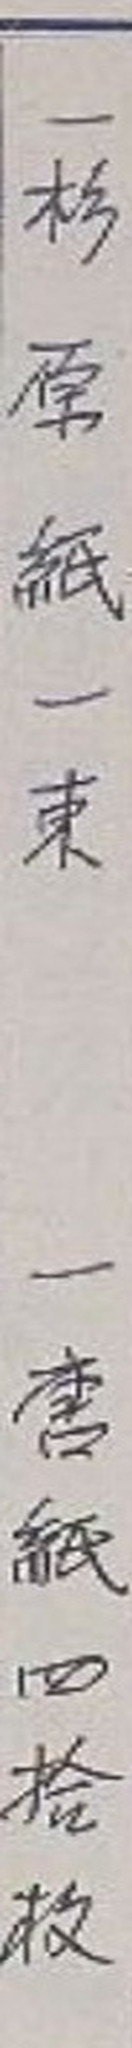一杉原紙一束一唐紙四拾枚
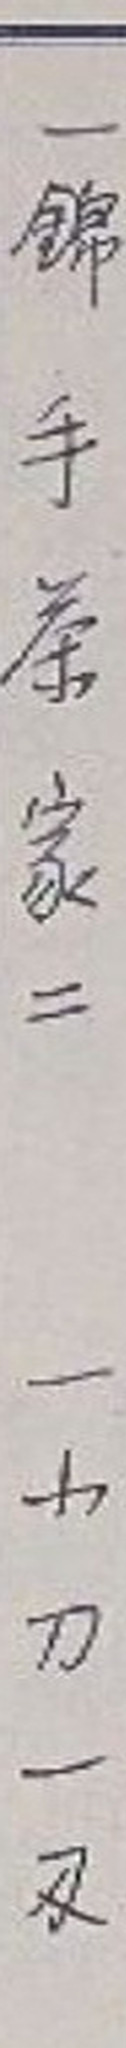一錦手茶家二一小刀一刃
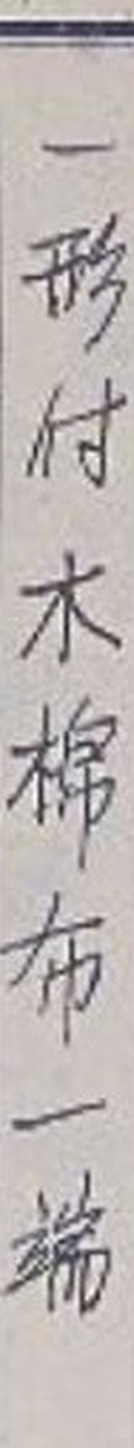一形付木棉布一端
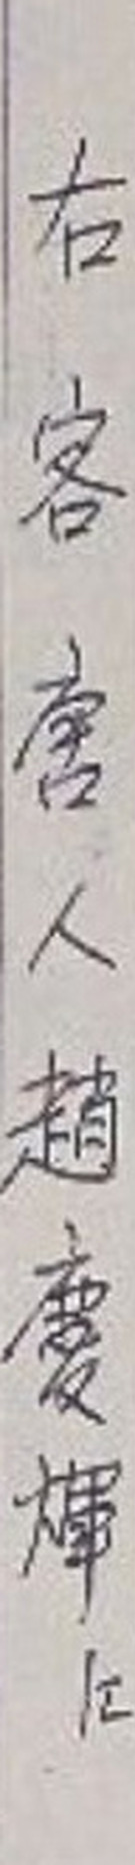右客唐人趙慶煇え
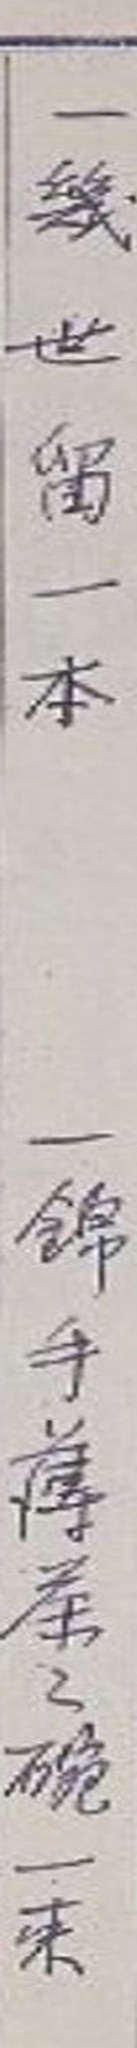一幾世留一本一錦手薄茶々碗一束
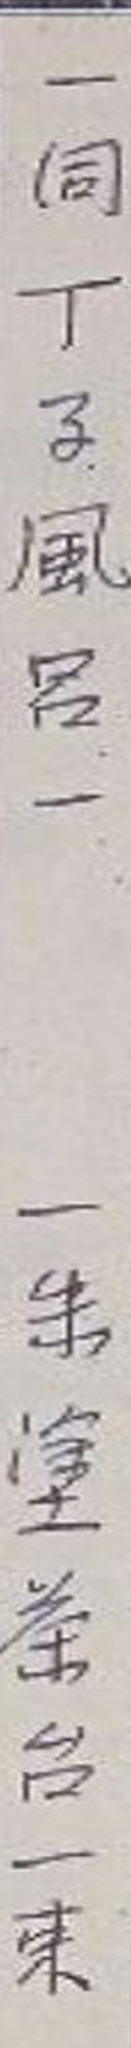一同丁子風呂一一朱塗茶台一束
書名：支那冊封使来琉諸記 下巻
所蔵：University of the Ryukyus Library
